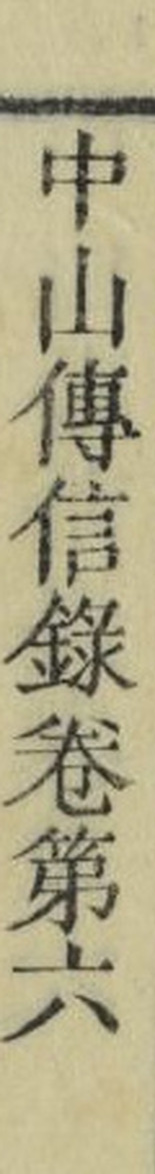中山伝信録巻第六

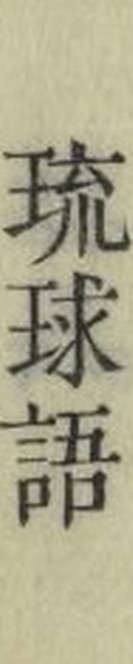琉球語
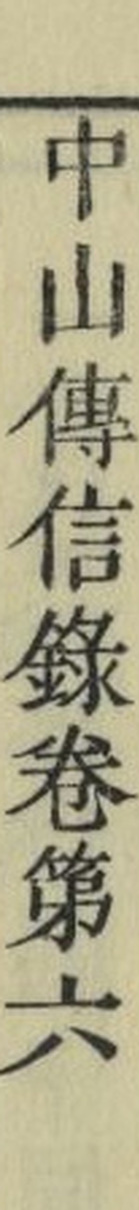中山伝信録巻第六
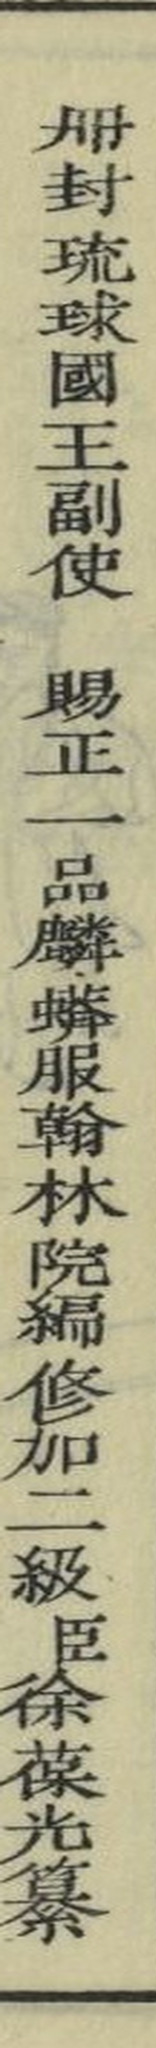冊封琉球国王副使賜正一品麟蟒服翰林院編修加二級臣徐葆光纂

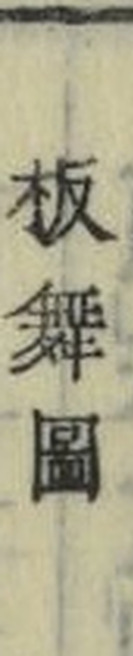板舞図

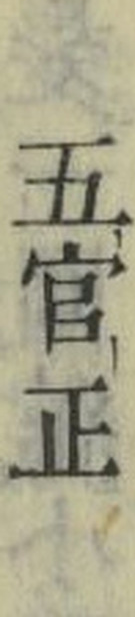五-官-正
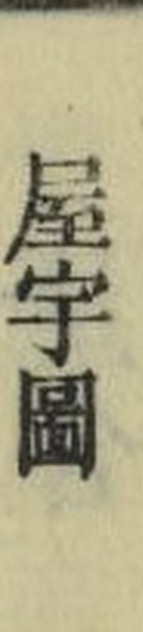屋宇図

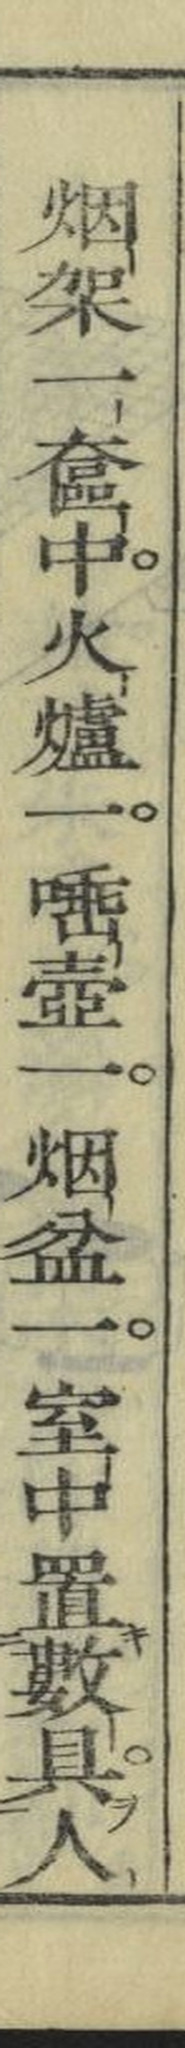煙-架一-奩-中。火-炉一。唾-壺一。煙-盆一。室-中置数-具。人-

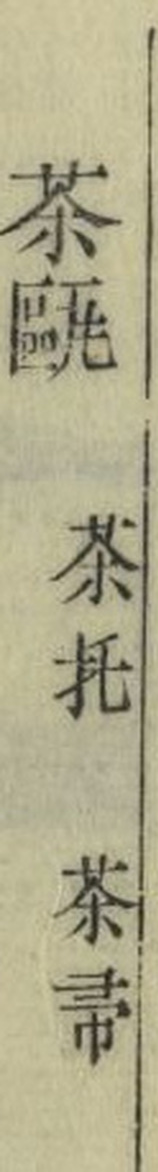茶甌茶托茶帚

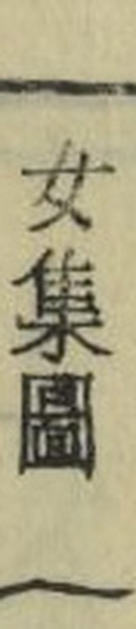女集図

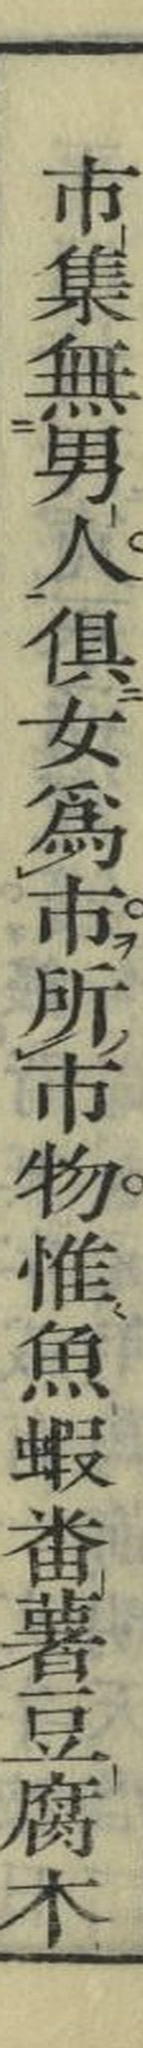市-集無男-人。俱女為市。所市物。惟〱魚-蝦番-薯豆-腐木-
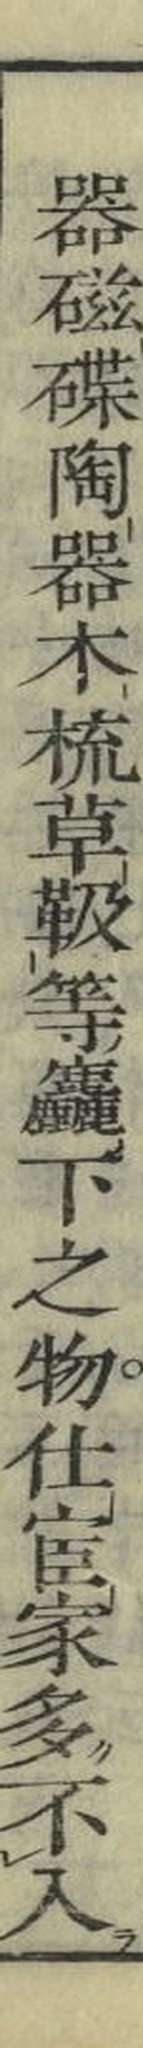器磁-碟陶-器木-梳草-靸-等麤-下之物。仕-宦-家多不入
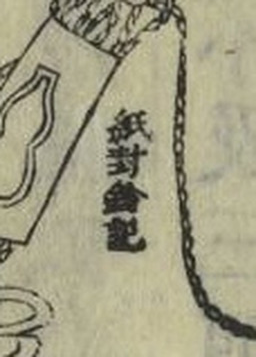紙封鈴記

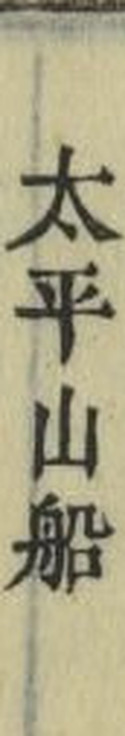太平山船
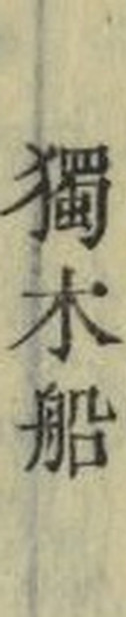独木船

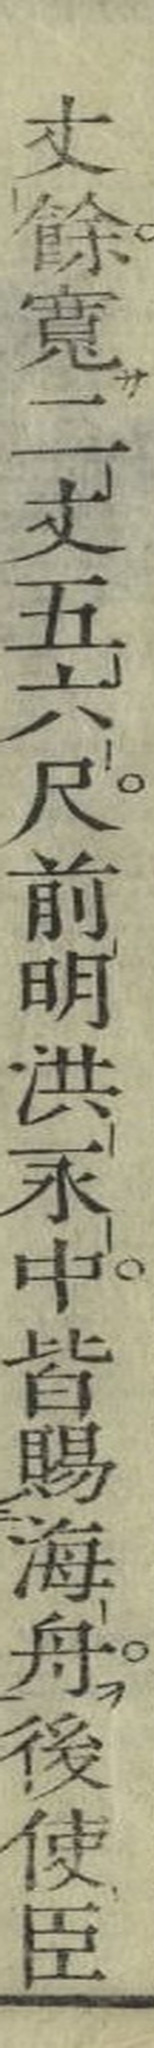丈-余。寛二-丈五-六-尺。前-明洪-永-中。皆賜海-舟。後使-臣
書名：中山伝信録 巻六
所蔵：University of the Ryukyus Library
